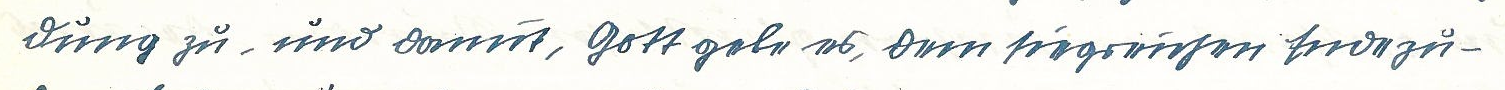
dung zu, und damit, Gott gebe es, dem siegreichen Ende zu –
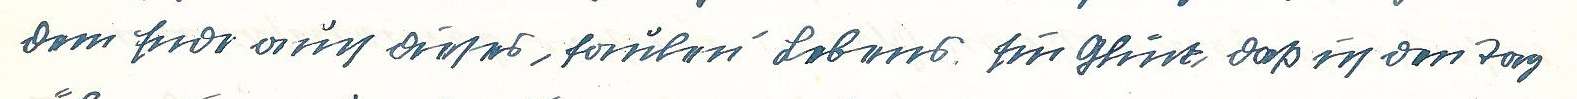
dem Ende auch dieses ‚faulen´ Lebens. Ein Glück, daß ich den Tag
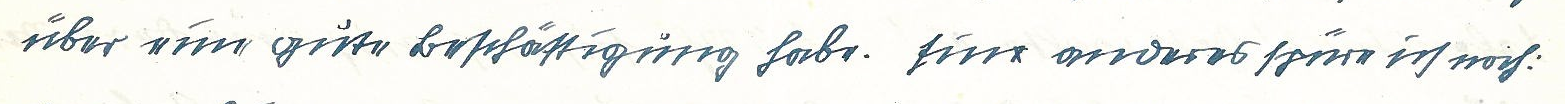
über eine gute Beschäftigung habe. Eine anderes spüre ich noch:
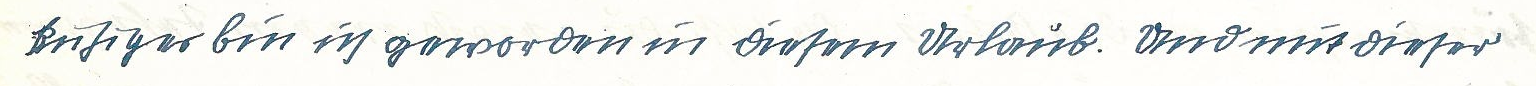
Ruhiger bin ich geworden in diesem Urlaub. Und mit dieser
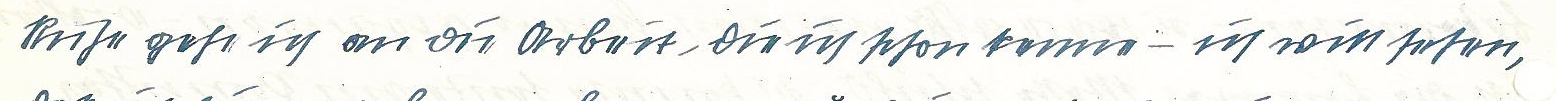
Ruhe gehe ich an die Arbeit, die ich schon kenne – ich will sehen,
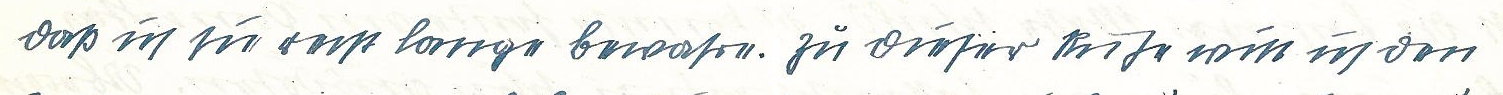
daß ich sie recht lange bewahre. Zu dieser Ruhe will ich den
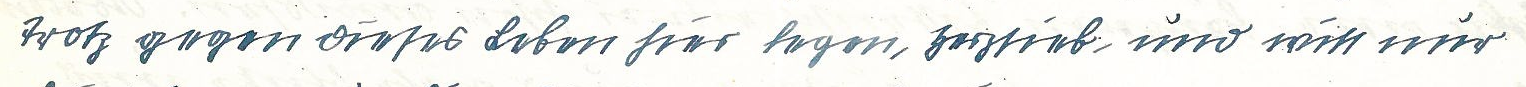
Trotz gegen dieses Leben hier legen, Herzlieb, und will nur
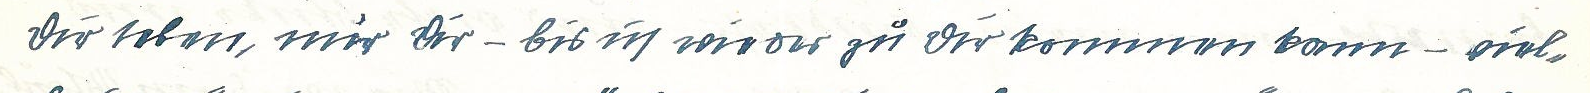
Dir leben, nur Dir – bis ich wieder zu Dir kommen kann – viel¬
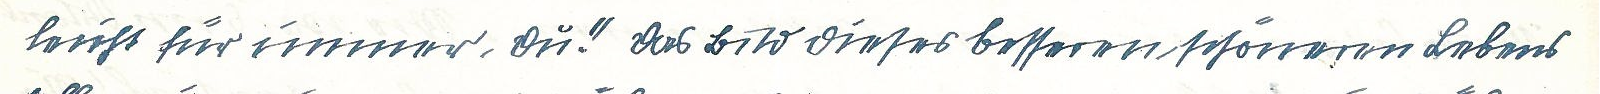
leicht für immer, Du!! Das Bild dieses besseren schöneren Lebens
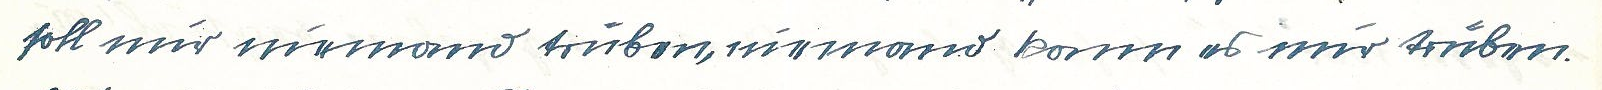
soll mir niemand trüben, niemand kann es mir trüben.
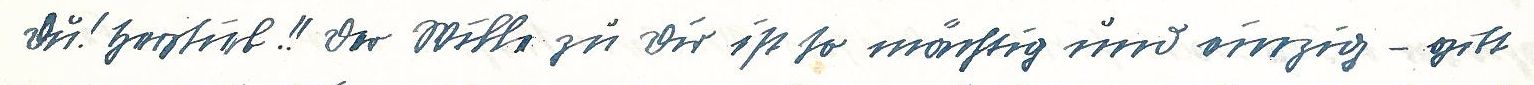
Du! Herzlieb!! Der Wille zu Dir ist so mächtig und einzig – gibt
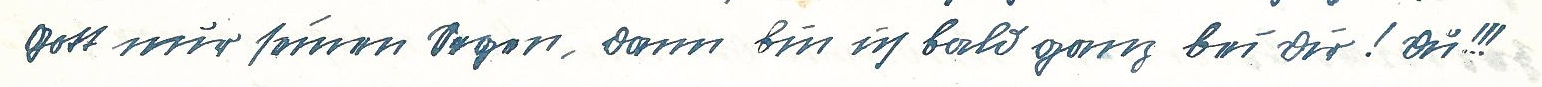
Gott mir seinen Segen, dann bin ich bald ganz bei Dir! Du!!!
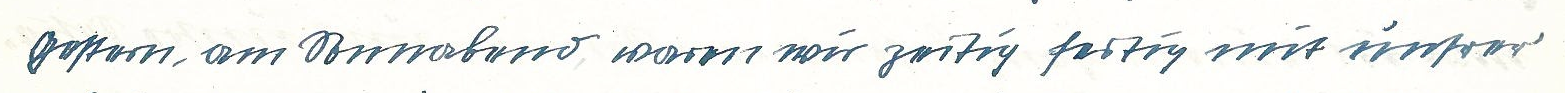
Gestern, am Sonnabend waren wir zeitig fertig mit unsrer
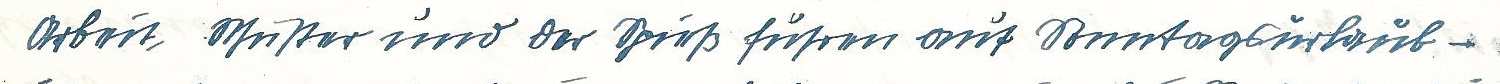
Arbeit, Sch. und der Spieß fuhren auf Sonntagsurlaub –
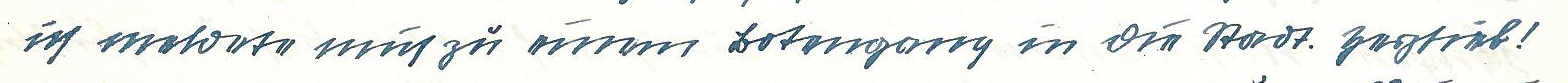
ich meldete mich zu einem Botengang in die Stadt. Herzlieb!
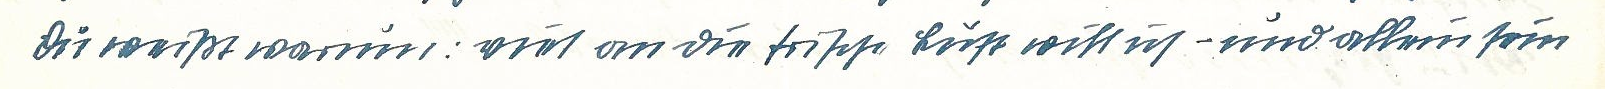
Du weißt warum: viel an die frische Luft will ich – und allein sein
